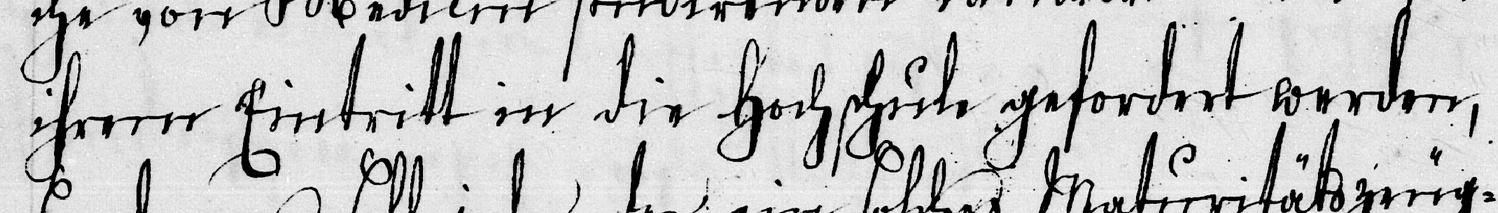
ihrem Eintritt in die Hochschule gefordert werden,
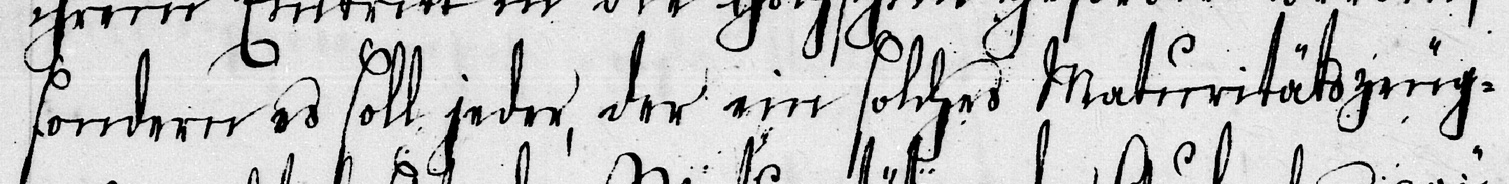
sondern es soll jeder, der ein solches Maturitätszeug¬
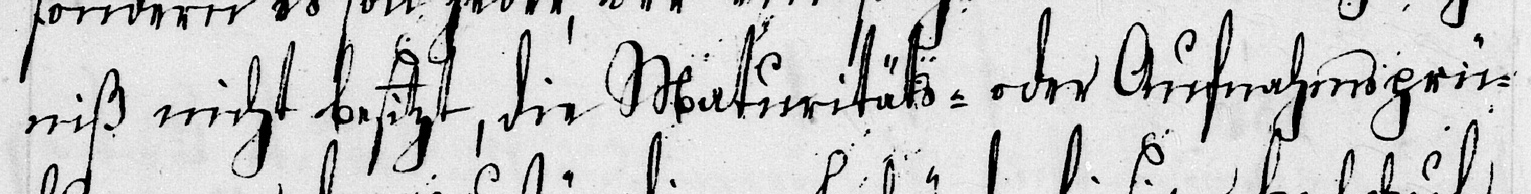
niß nicht besitzt, die Maturitäts- oder Aufnahmeprü¬
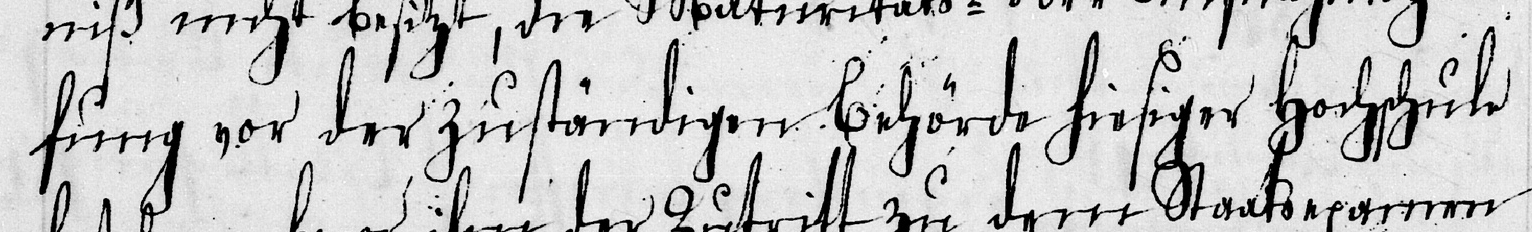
fung vor der zuständigen Behörde hiesiger Hochschule
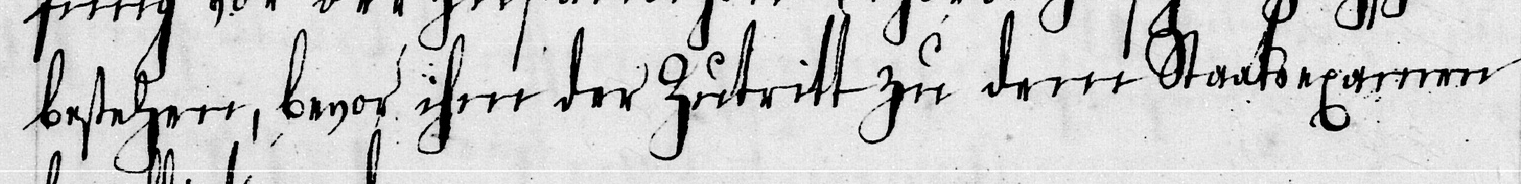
bestehen, bevor ihm der Zutritt zu dem Staatsexamen
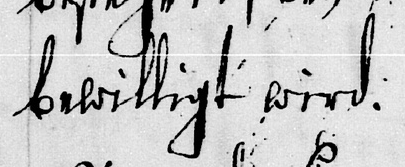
bewilligt wird.
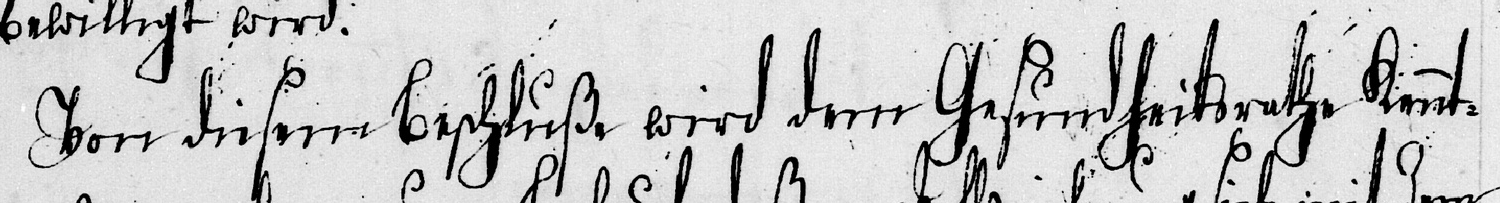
Von diesem Beschluße wird dem Gesundheitsrathe Ken¬
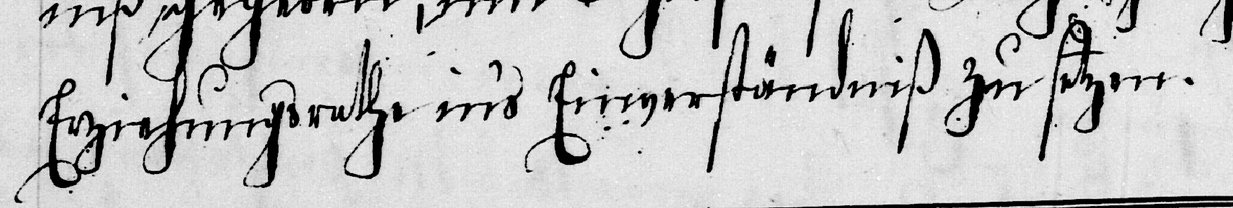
Erziehungsrathe ins Einverständniß zu setzen.
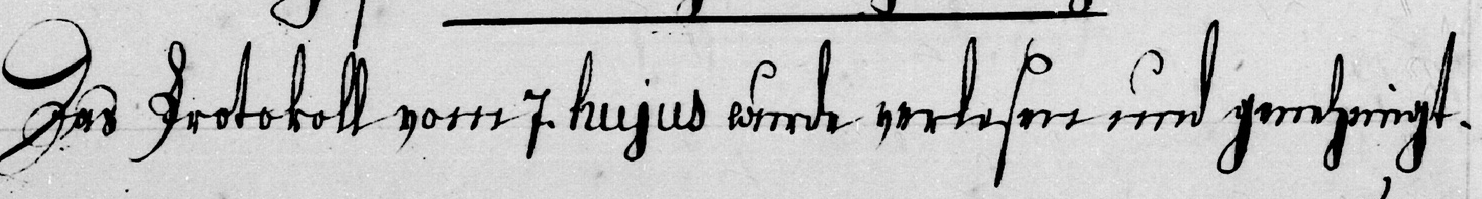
Das Protokoll vom 7. hujus wurde verlesen und genehmigt.
